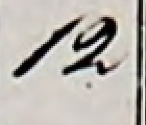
12
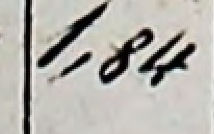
1,84
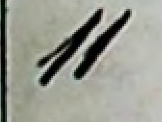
11
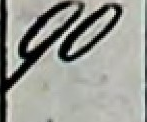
90
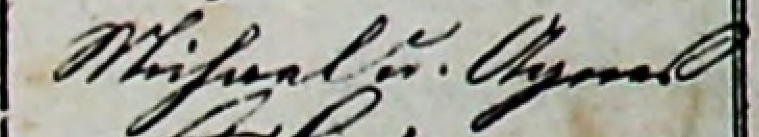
Michael u. Agnes
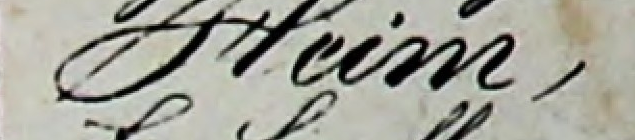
Heim
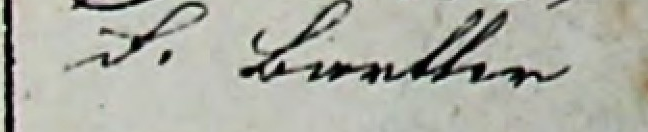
v. Bartter
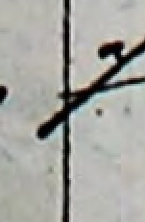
7
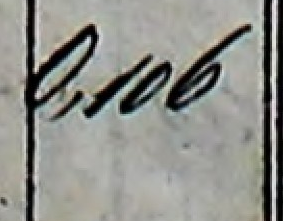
0,106
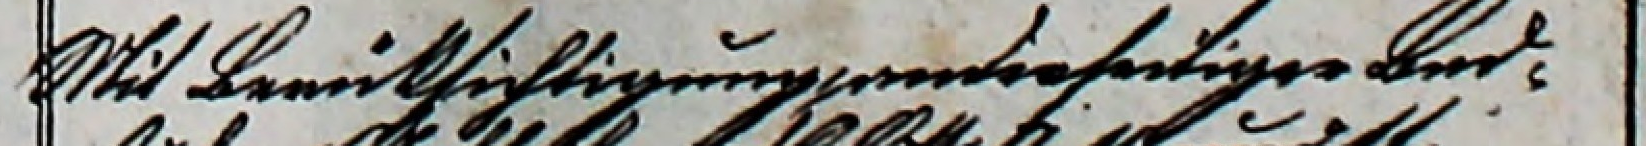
Mit Berücksichtigung???tiger Bad„
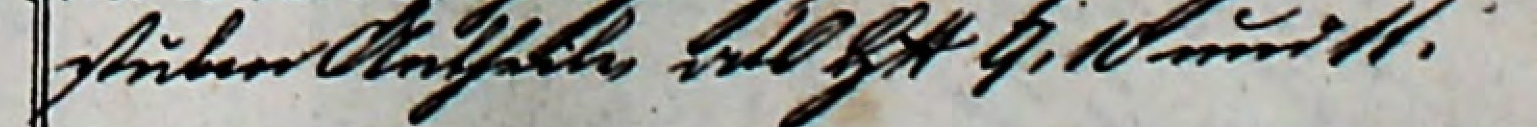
stuben Antheile als Hn 9, 10 und 11.
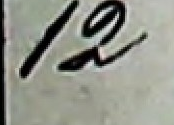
12
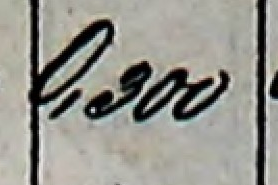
0,300
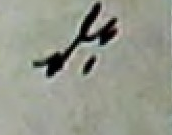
do
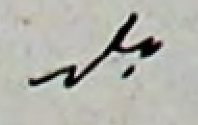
do
